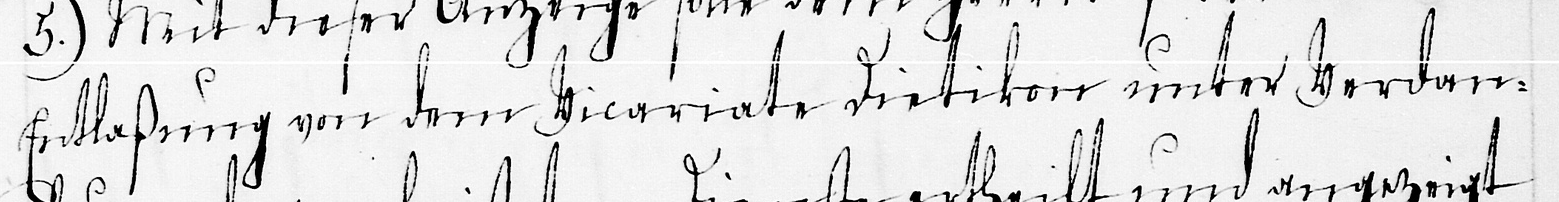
Entlaßung von dem Vicariate Dietikon unter Verdan¬
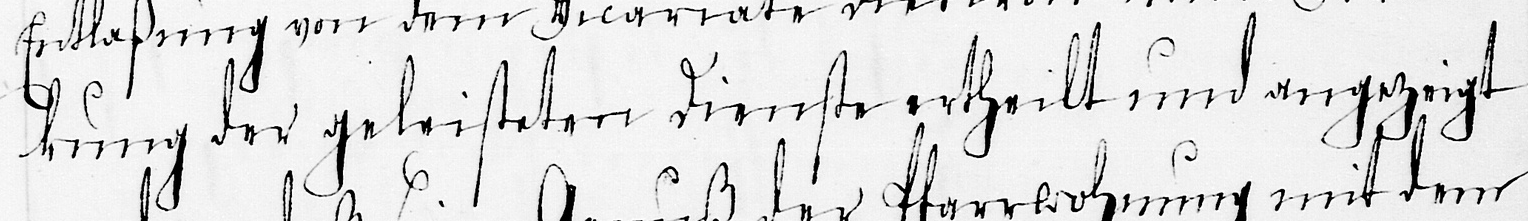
kung der geleisteten Dienste ertheilt und angezeigt
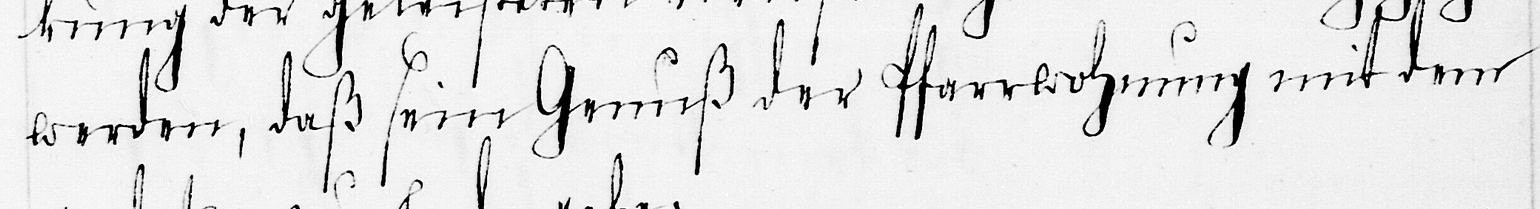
werden, daß sein Genuß der Pfarrwohnung mit dem
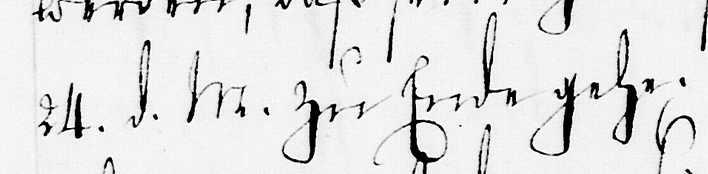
24. d. M. zu Ende gehe.
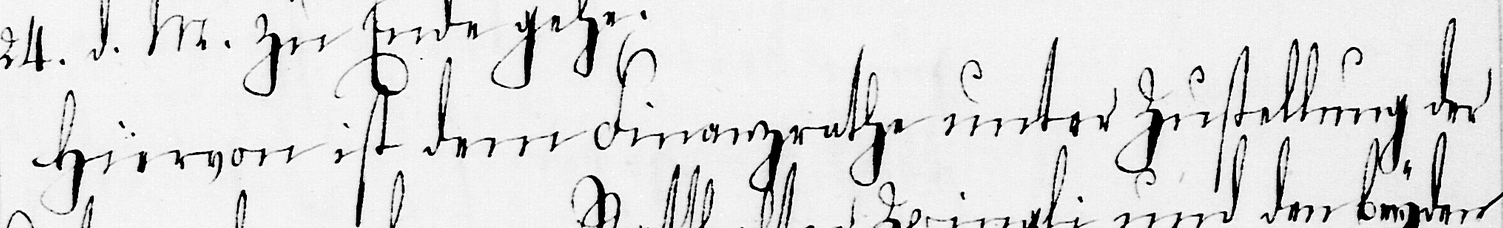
Hiervon ist dem Finanzrathe unter Zustellung der
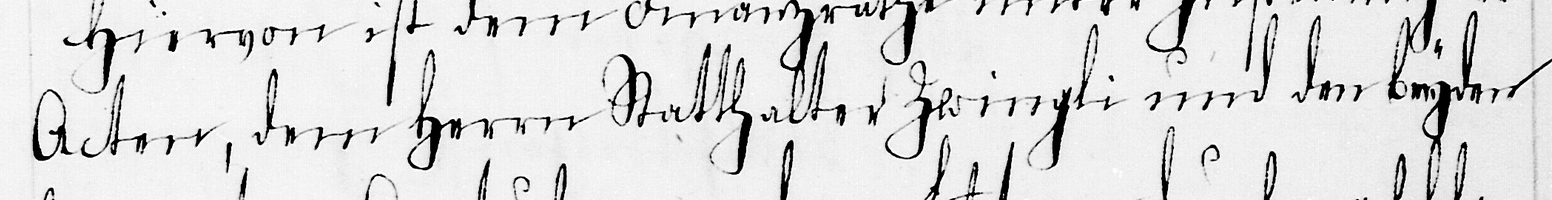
Acten, dem Herrn Statthalter Zwingli und den beyden
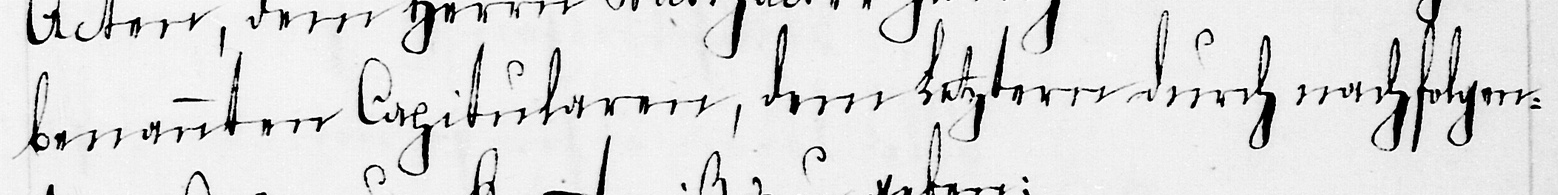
benannten Capitularen, dem Letztern durch nachfolgen¬
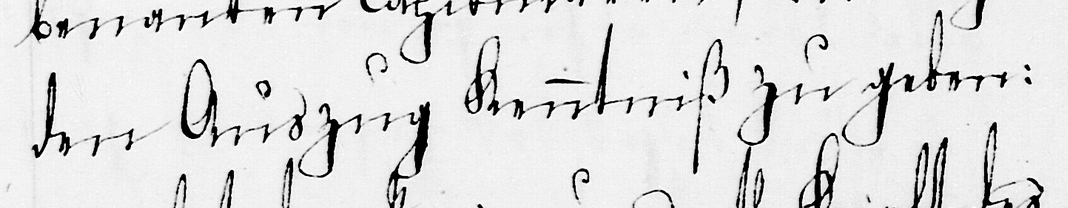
den Auszug Kenntniß zu geben:
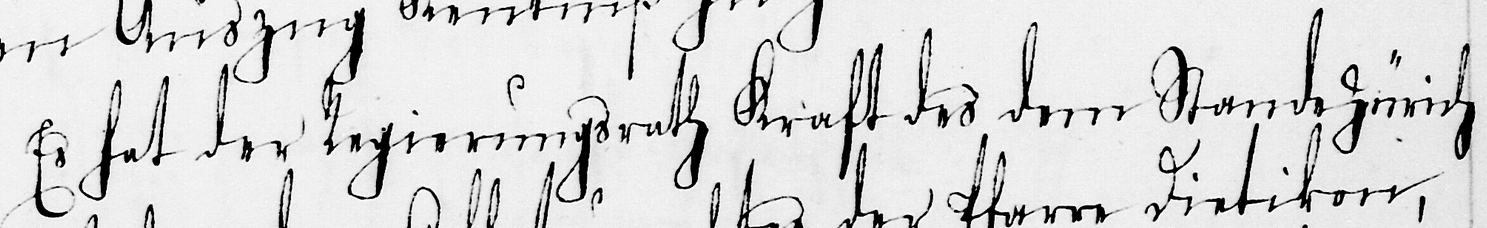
Es hat der Regierungsrath Kraft des dem Stande Zürich
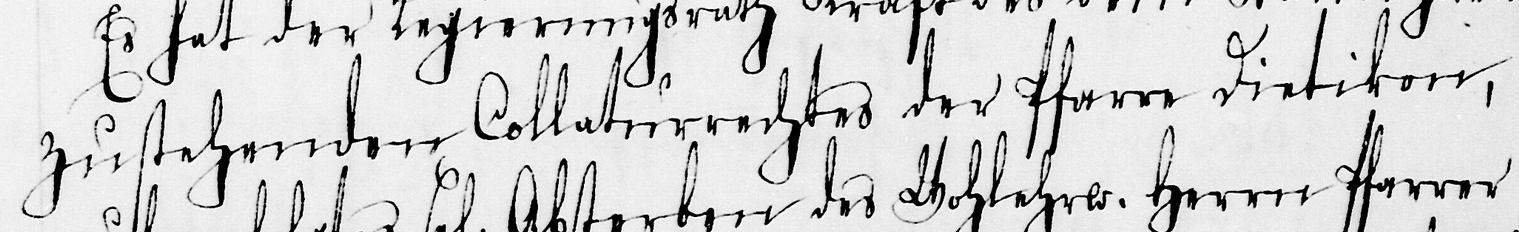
zustehenden Collaturrechtes der Pfarre Dietikon,
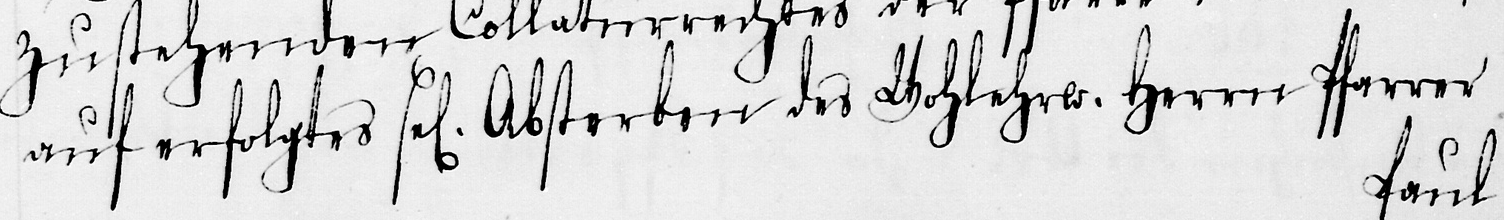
auf erfolgtes sel. Absterben des Wohlehrw. Herrn Pfarrer
